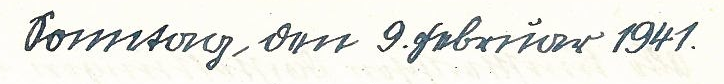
Sonntag, den 9. Februar 1941.
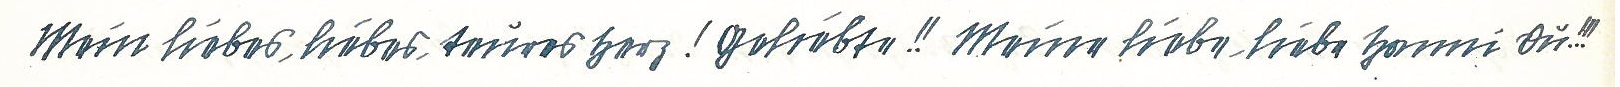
Mein liebes, liebes, teures Herz! Geliebte!! Meine liebe, liebe Du!!!
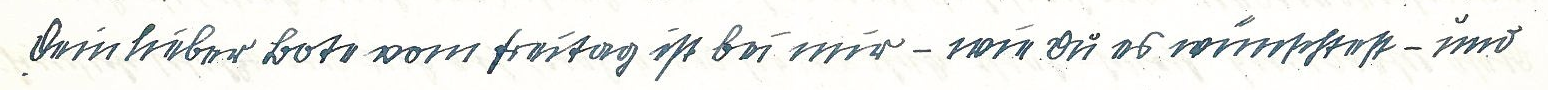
Dein lieber Bote vom Freitag ist bei mir – wie Du es wünschtest – und
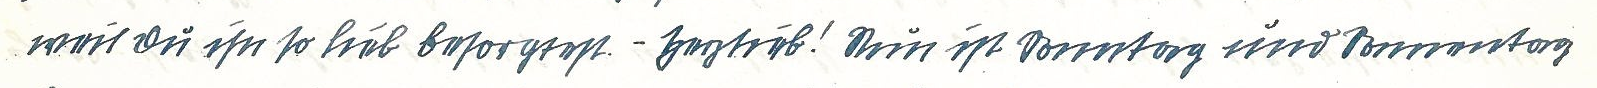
weil Du ihn so lieb besorgtest. – Herzlieb! Nun ist Sonntag und Sonnentag
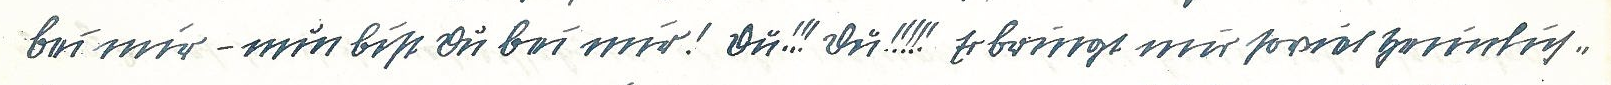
bei mir – nun bist Du bei mir! Du!!! Du!!!!! Er bringt mir so viel Heimlich¬
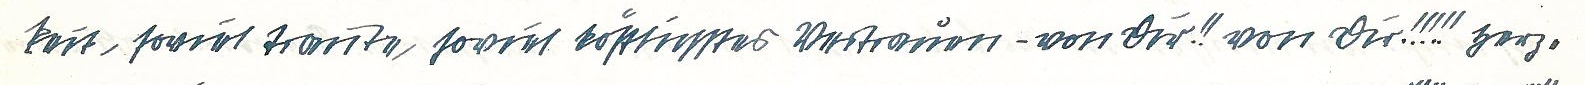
keit, soviel Traute, soviel köstliches Vertrauen – von Dir!! Von Dir!!!!! Herz¬
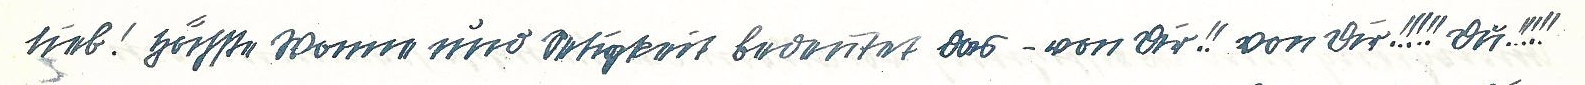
lieb! Höchste Wonne und Seligkeit bedeutet das – von Dir!! Von Dir!!!!! Du!!!!!
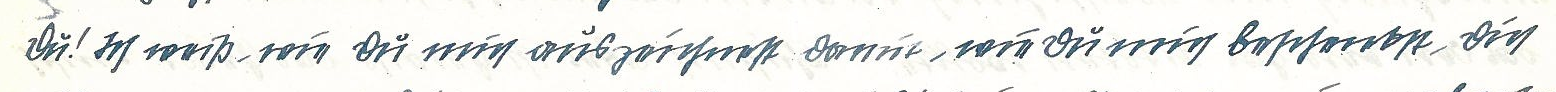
Du! Ich weiß, wie Du mich auszeichnest damit, wie Du mich beschenkst, Dich
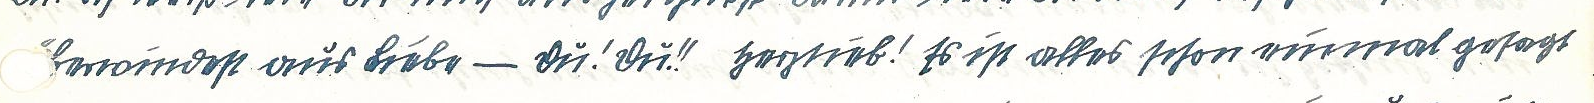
berwindest aus Liebe – Du! Du!! Herzlieb! Es ist alles schon einmal gesagt
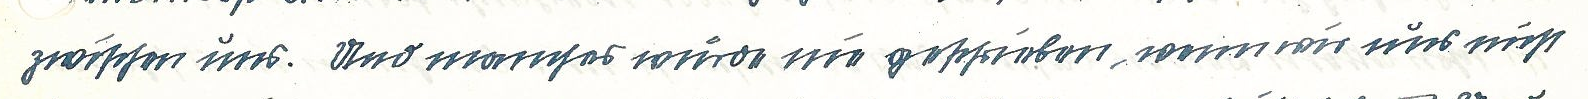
zwischen uns. Und manches würde nie geschrieben, wenn wir uns nicht
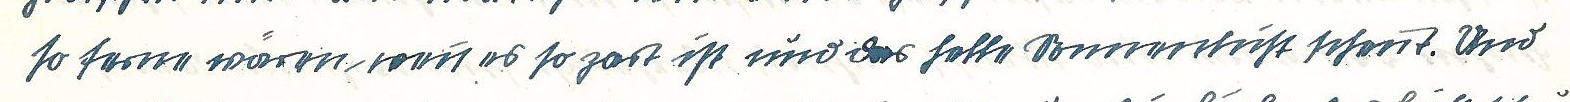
so ferne wären, weil es so zart ist und das satte Sonnenlicht scheut. Und
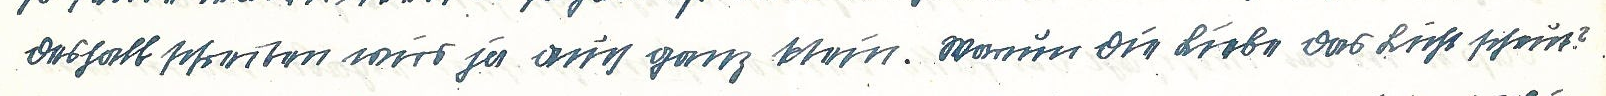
deshalb schreiben wir ja auch ganz klein. Warum die Liebe das Licht scheut?
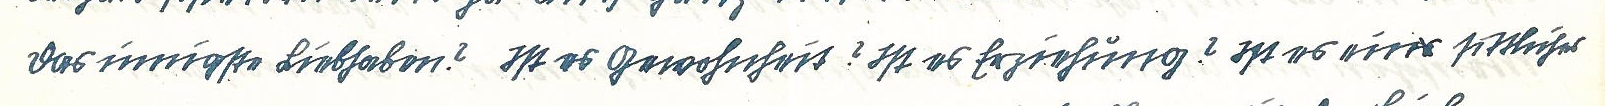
Das innigste Liebhaben? Ist es Gewohnheit? Ist es Erziehung? Ist es eins sittliches
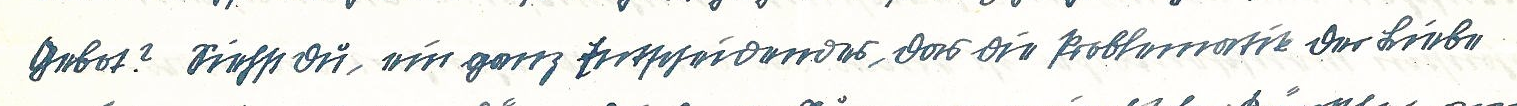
Gebot? Siehst Du, ein ganz Entscheidendes, das die Problematik der Liebe
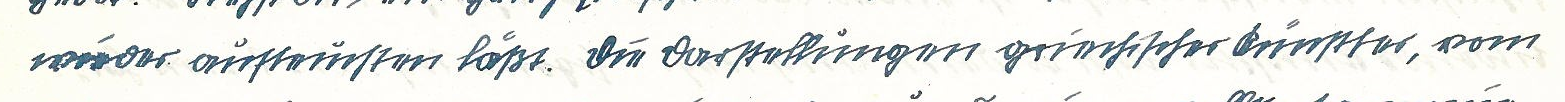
wieder aufleuchten läßt. Die Darstellungen griechischer Künstler, vom
